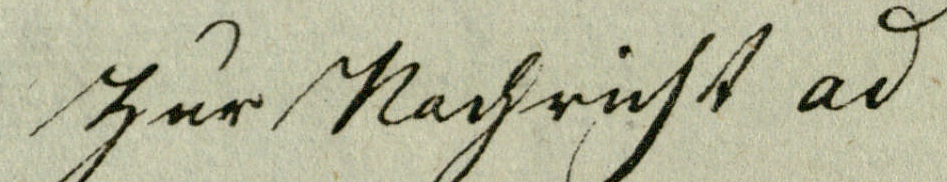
Zur Nachricht ad
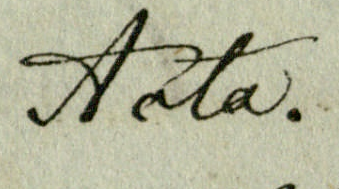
Acta.
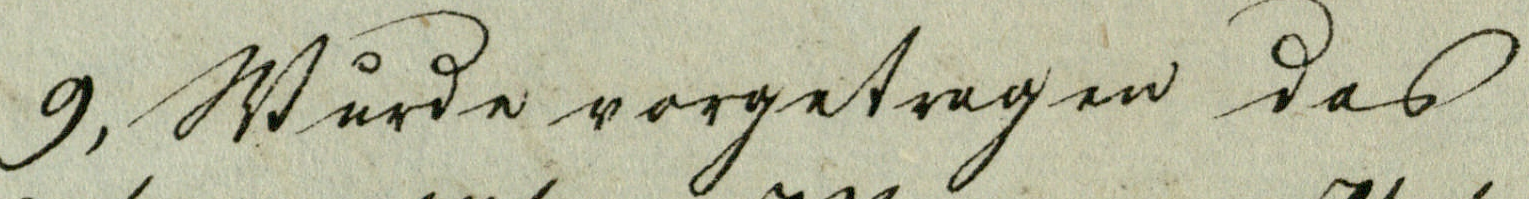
9, Wurde vorgetragen das
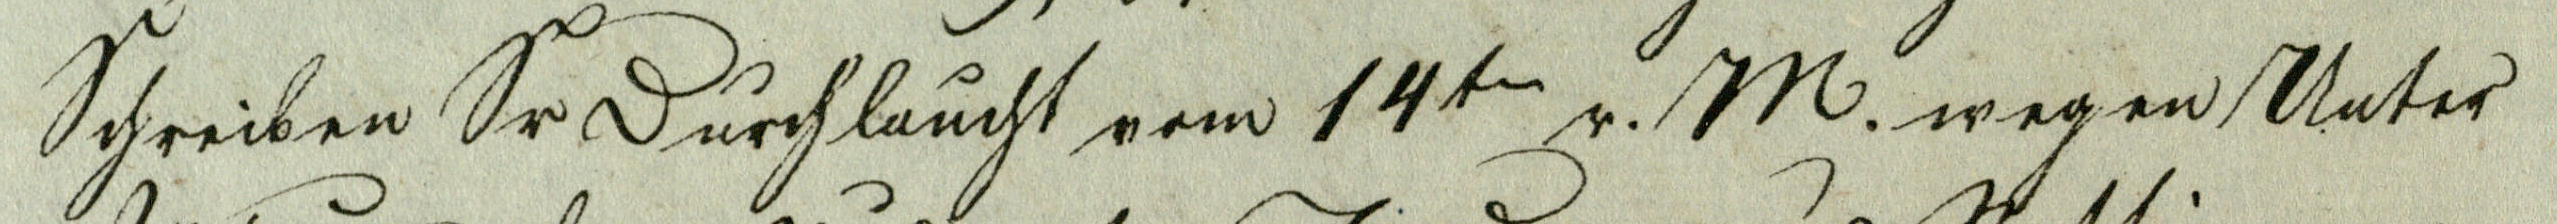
Schreiben Sr Durchlaucht vom 14ten v. M. wegen Unter¬
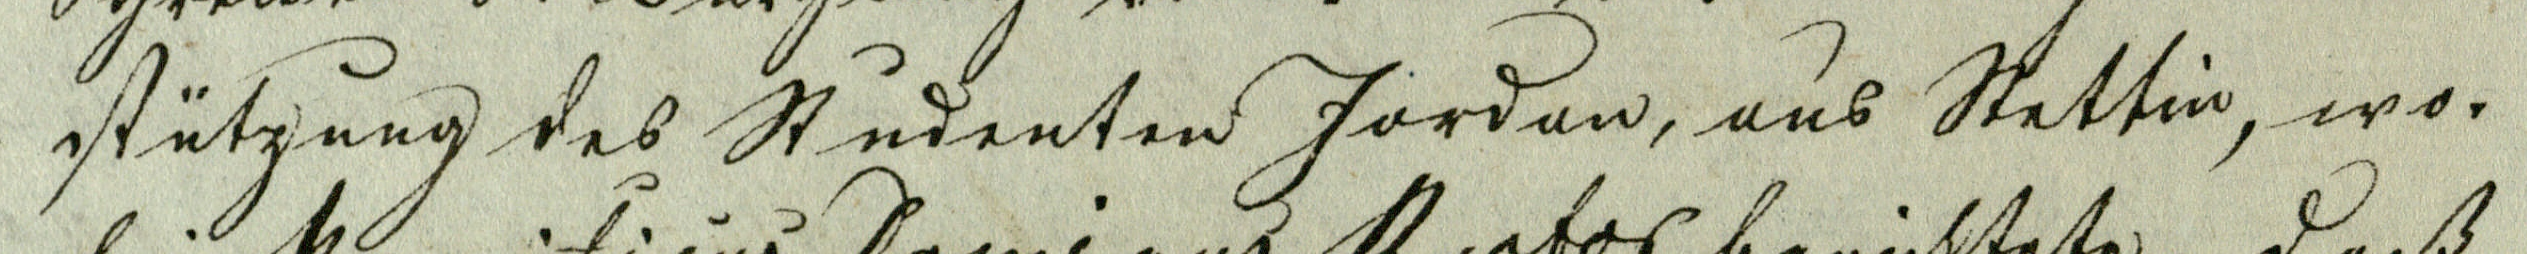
stützung des Studenten Jordan, aus Stettin, wo¬
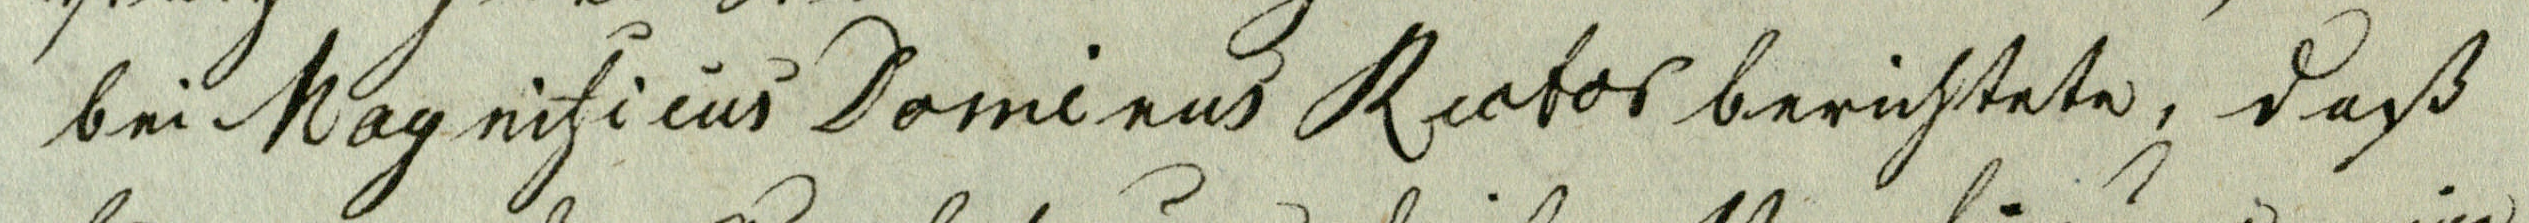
bei Magnificus Dominus Rector berichtete, daß
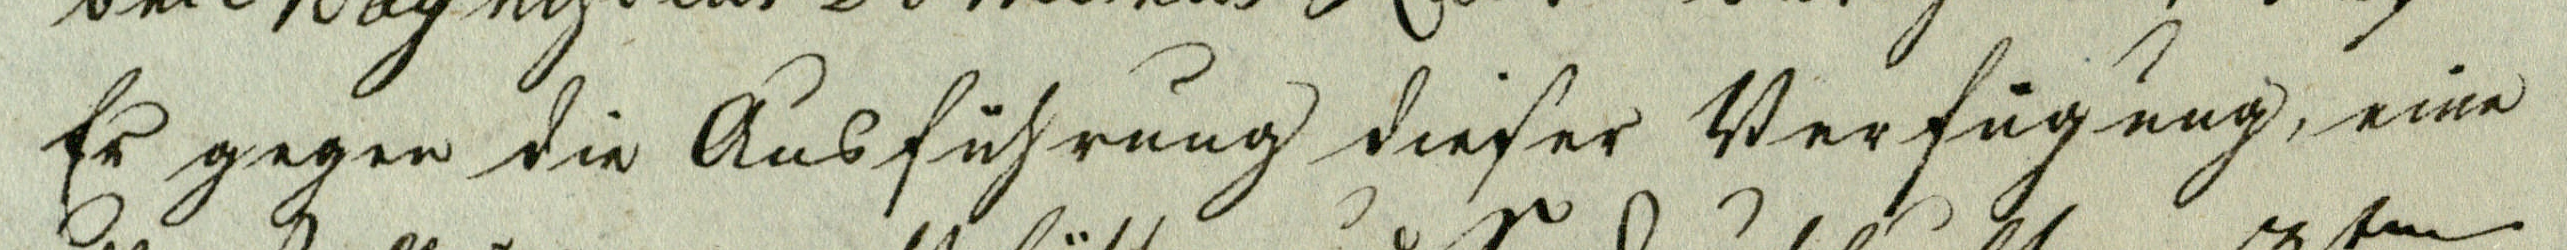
Er gegen die Ausführung dieser Verfügung , eine
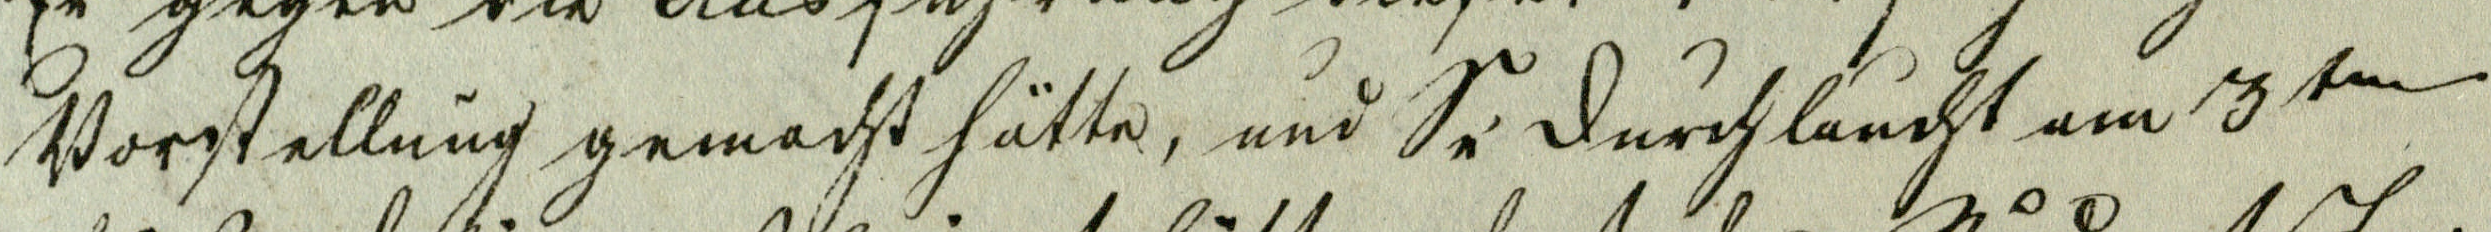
Vorstellung gemacht hätte, und Sr Durchlaucht am 3ten
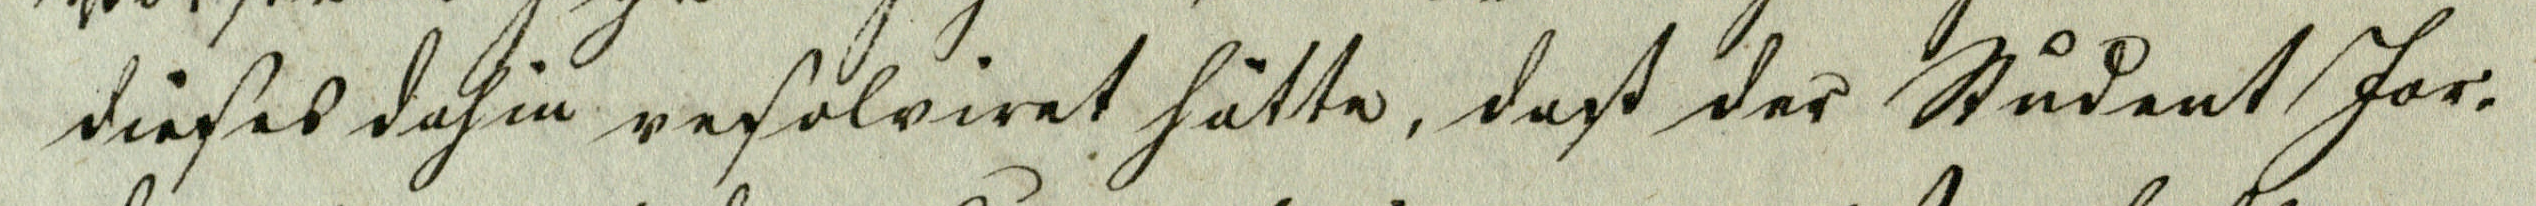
dieses dahin resolviret hätte, daß der Student Jor¬
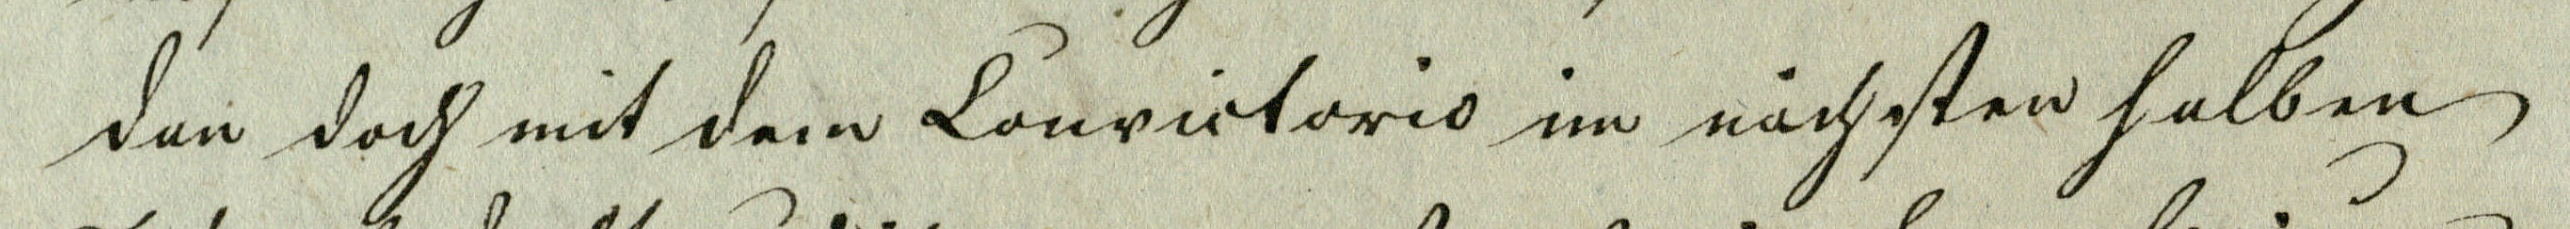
dan doch mit dem Convictorio im nächsten halben
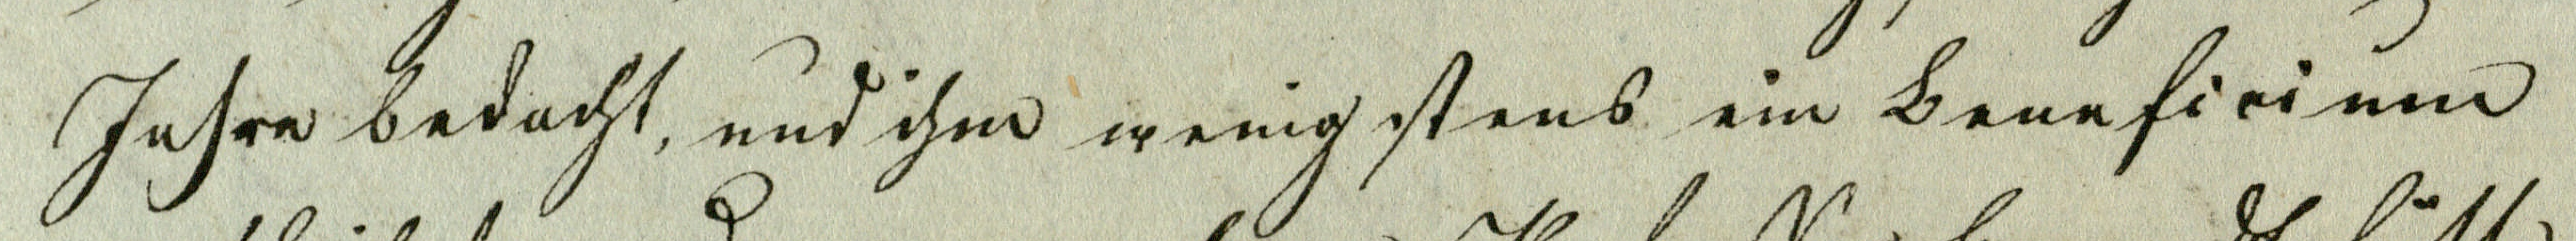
Jahre bedacht, und ihm wenigstens ein Beneficium
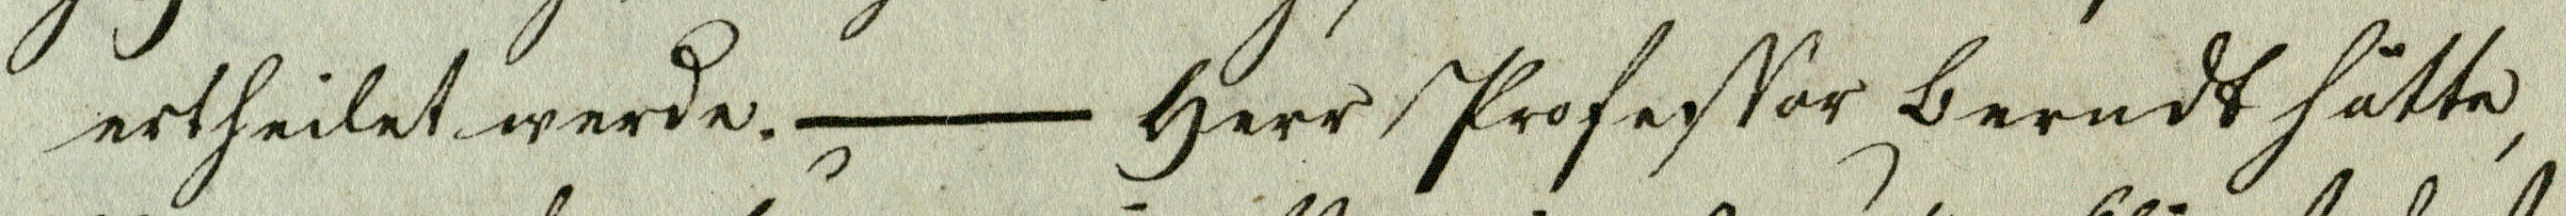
ertheilet werde. - Herr Professor Berndt hätte
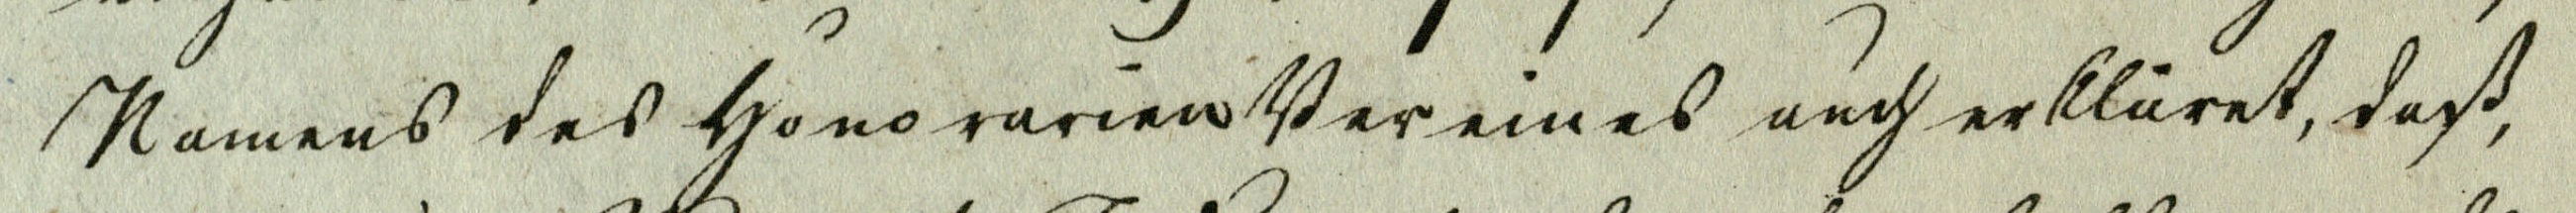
Namens des HonorarienVereines auch erkläret, daß,
